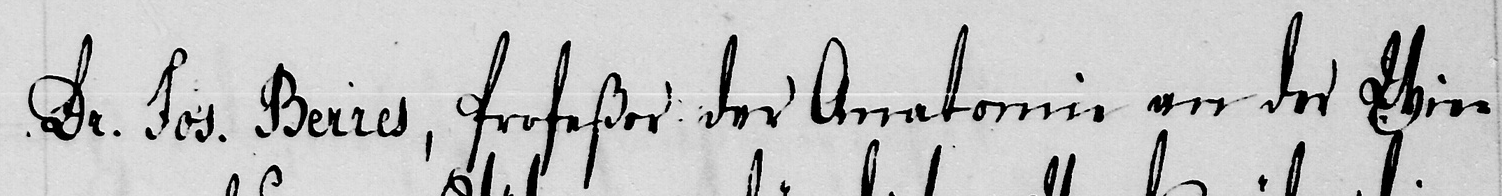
Dr. Jos. Berres, Profeßor der Anatomie an der Wie¬
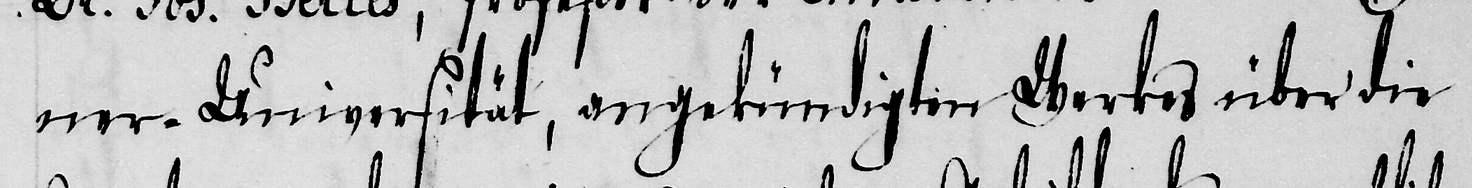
ner-Universität, angekündigten Werkes über die
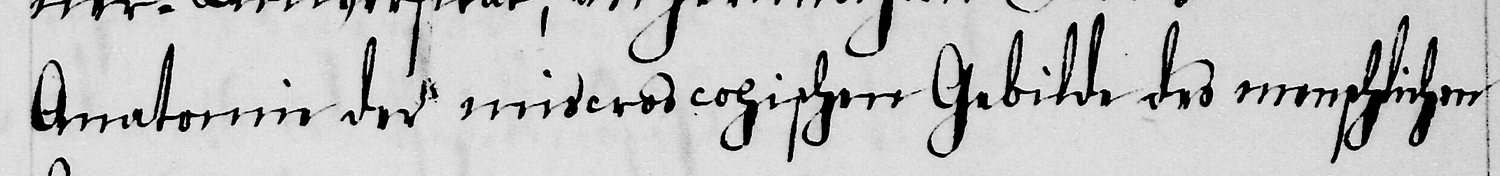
Anatomie der miscroscopischen Gebilde des menschlichen
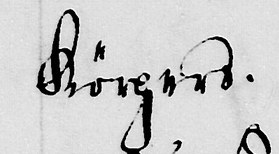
Körpers.
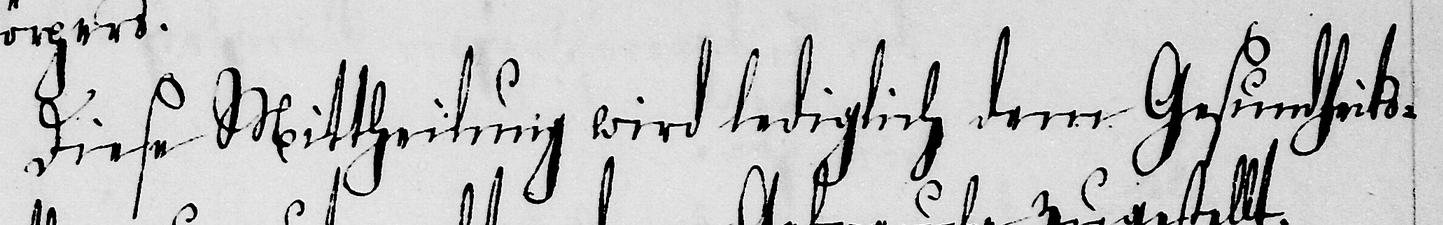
Diese Mittheilung wird lediglich dem Gesundheits¬
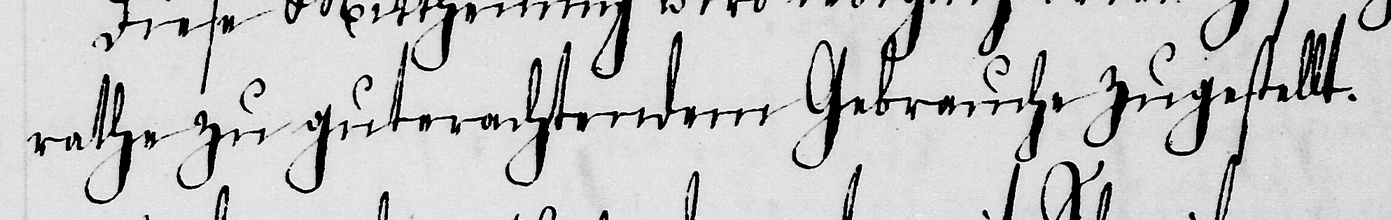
rathe zu guterachtendem Gebrauche zugestellt.
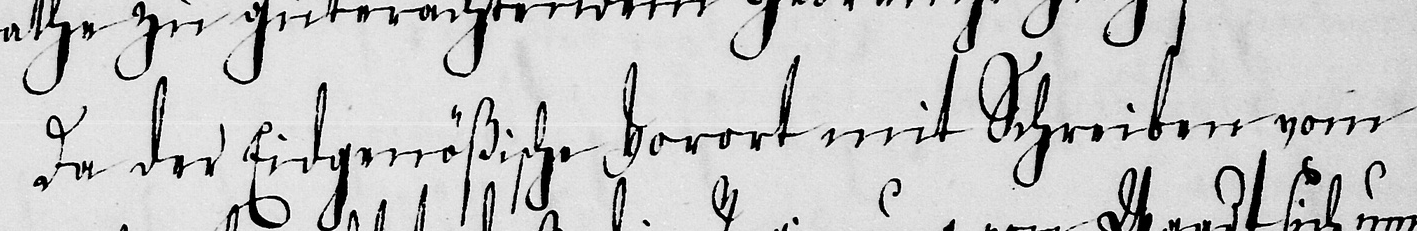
Da der Eidgenößische Vorort mit Schreiben vom
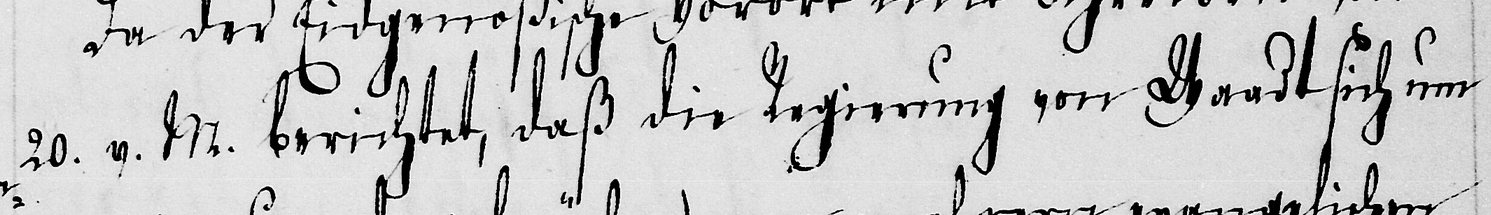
20. v. M. berichtet, daß die Regierung von Waadt sich um
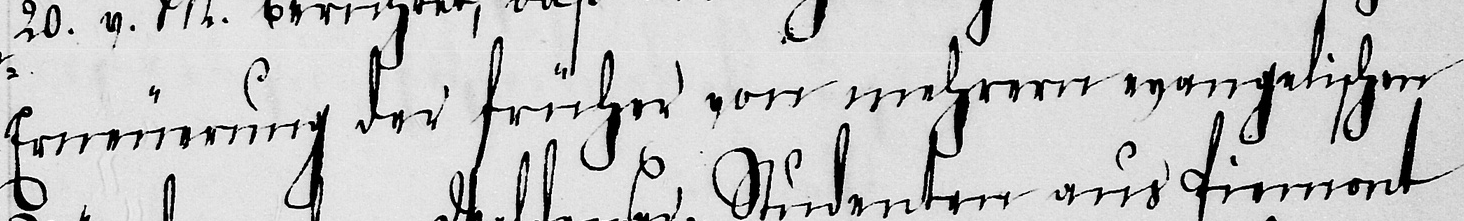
Erneuerung der früher von mehrern evangelischen
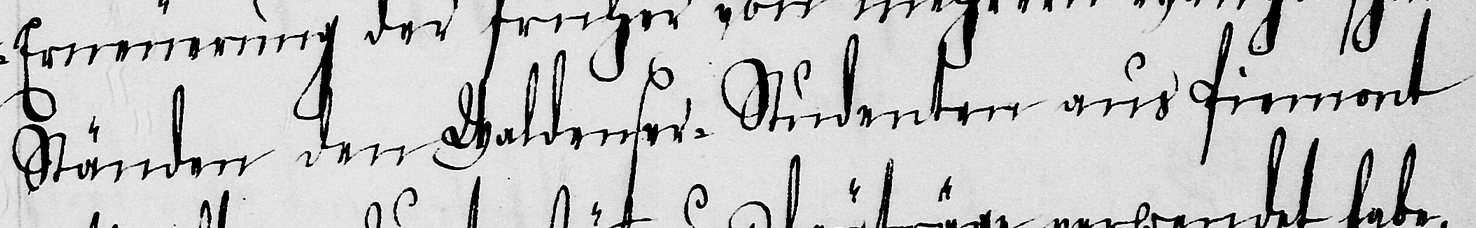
Ständen den Waldenser-Studenten aus Piemont
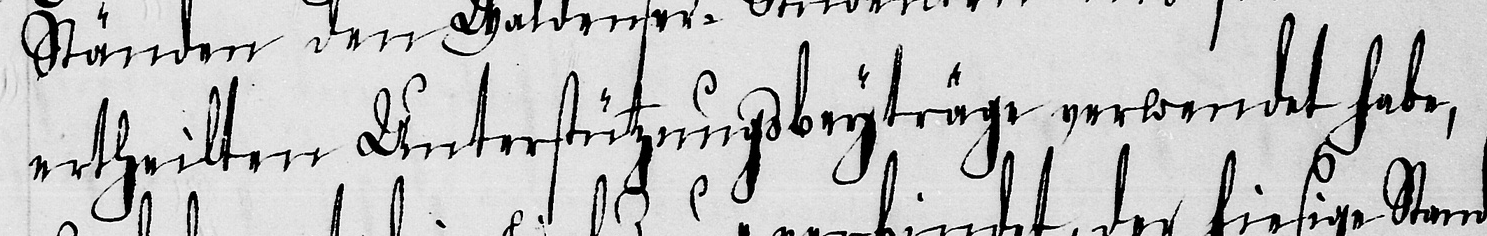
ertheilten Unterstützungsbeyträge verwendet habe,
